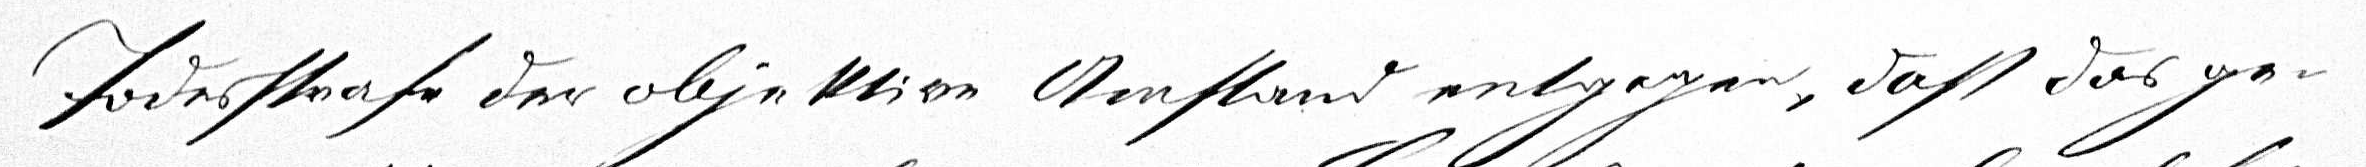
Todesstrafe der objektive Umstand entgegen, daß das ge¬
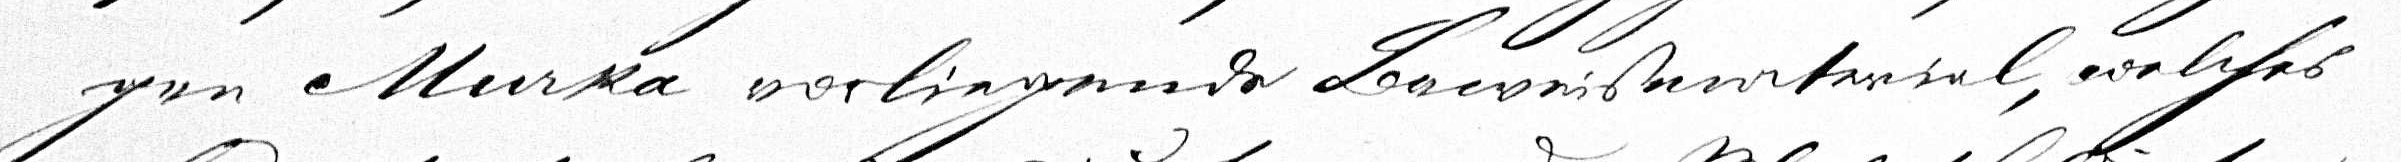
gen Murka vorliegende Beweismaterial, welches
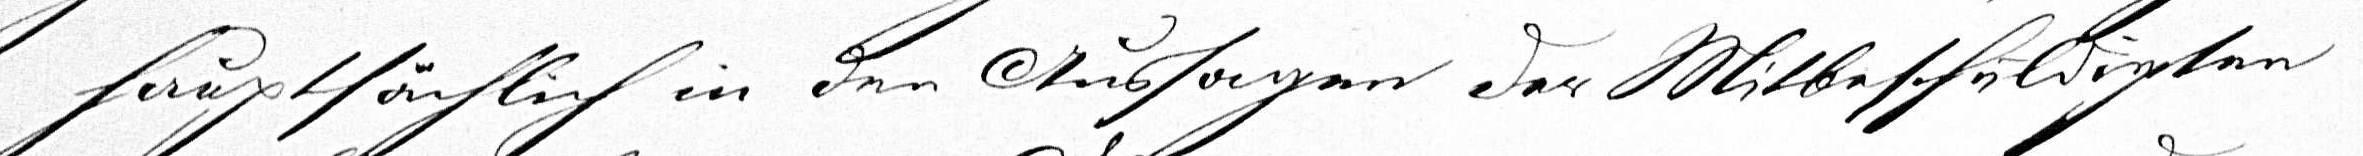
hauptsächlich in den Aussagen der Mitbeschuldigten
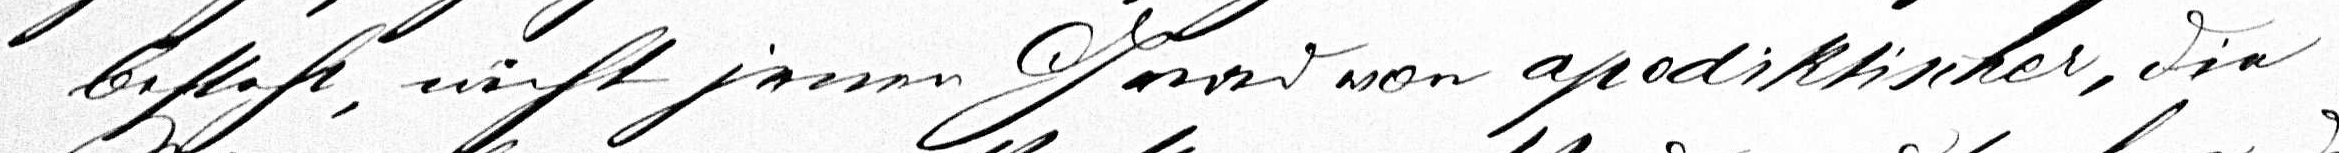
besteht, nicht jenen Grad von apodiktischer, die
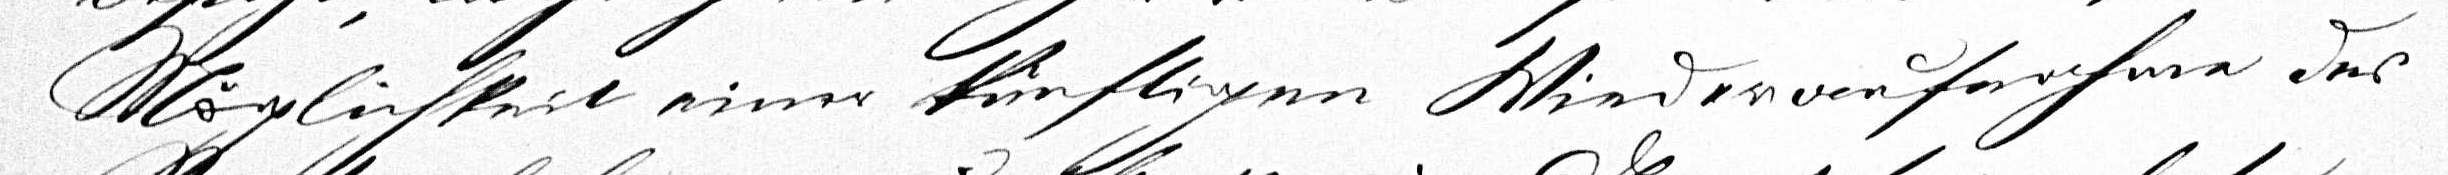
Möglichkeit einer künftigen Wieder des
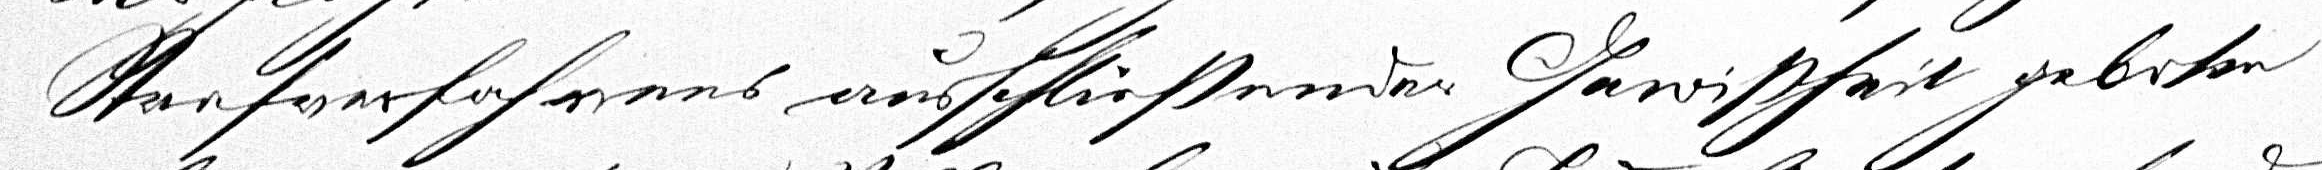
Strafverfahrens ausschließender Gewißheit geboten
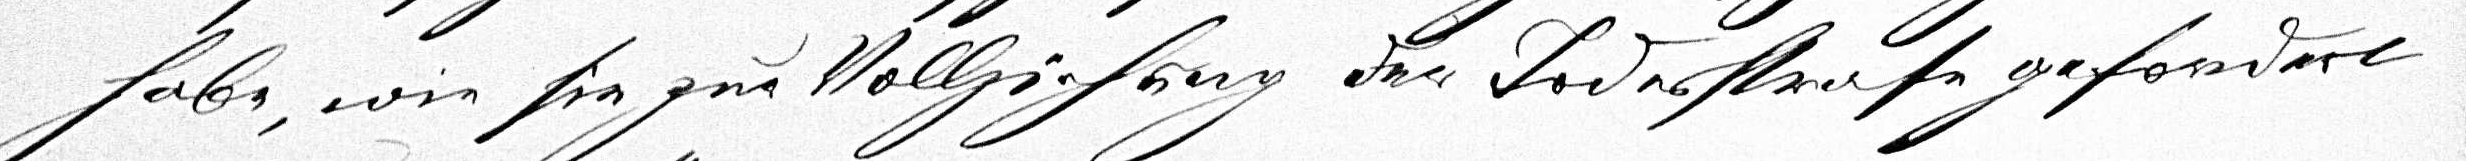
habe, wie sie zur Vollziehung der Todesstrafe gefordert
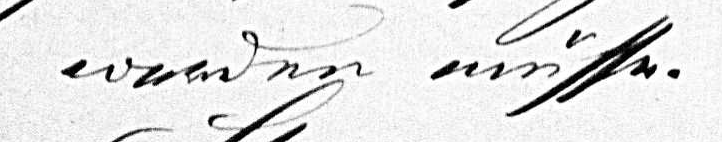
werden müsse.
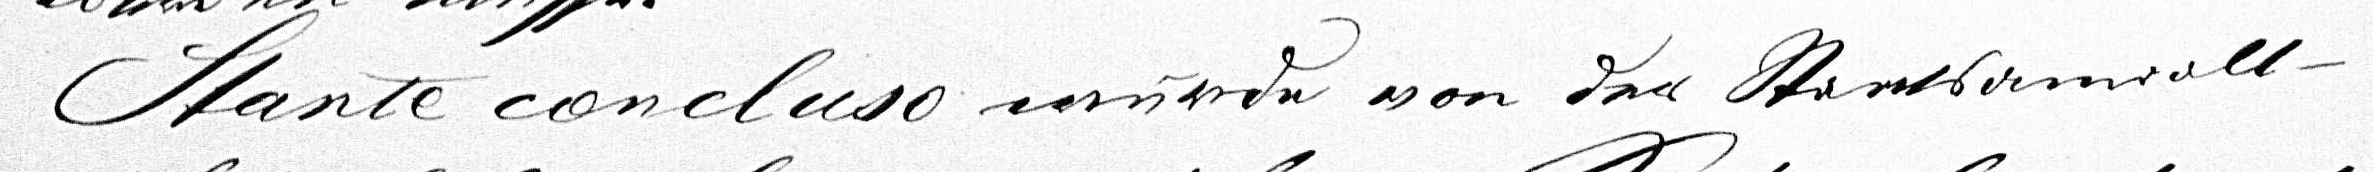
Stante concluso wurde von der Staatsanwalt¬
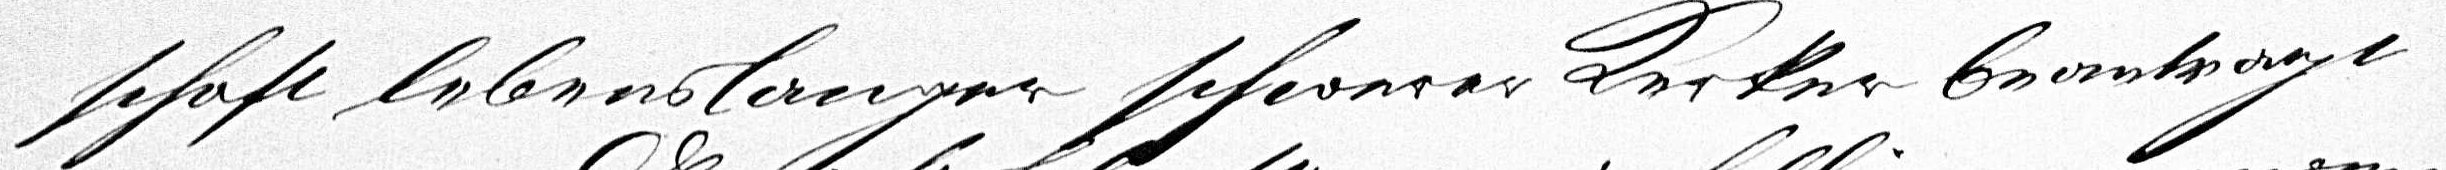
schaft lebenslanger schwerer Kerker beantragt
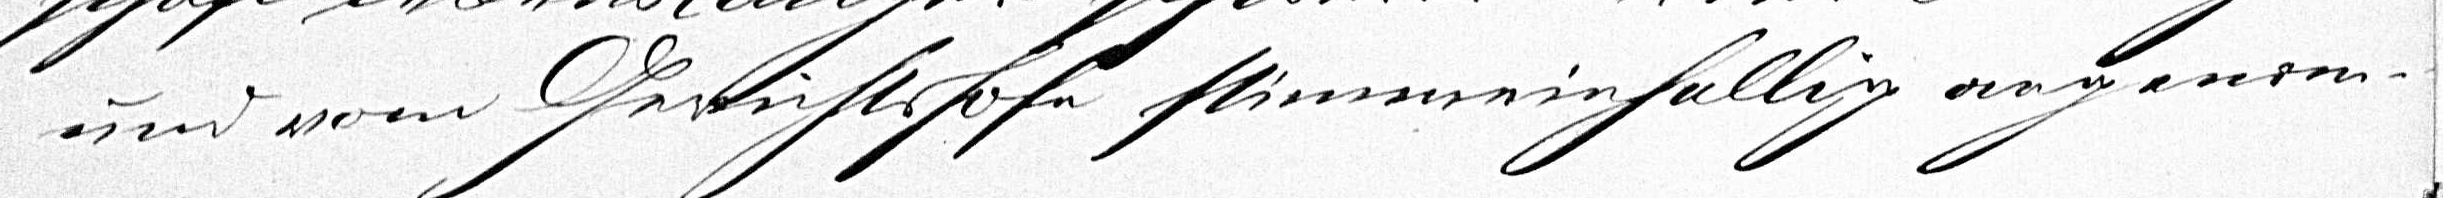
und vom Gerichtshofe stimmeinhellig angenom¬
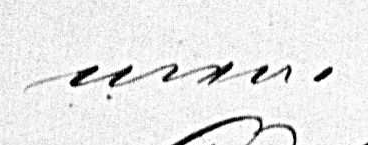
men.
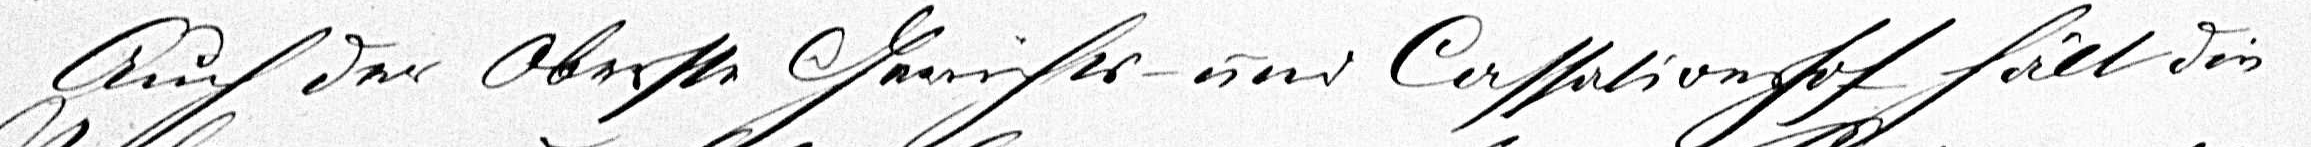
Auch der Oberste Gerichts- und Cassationshof hält die
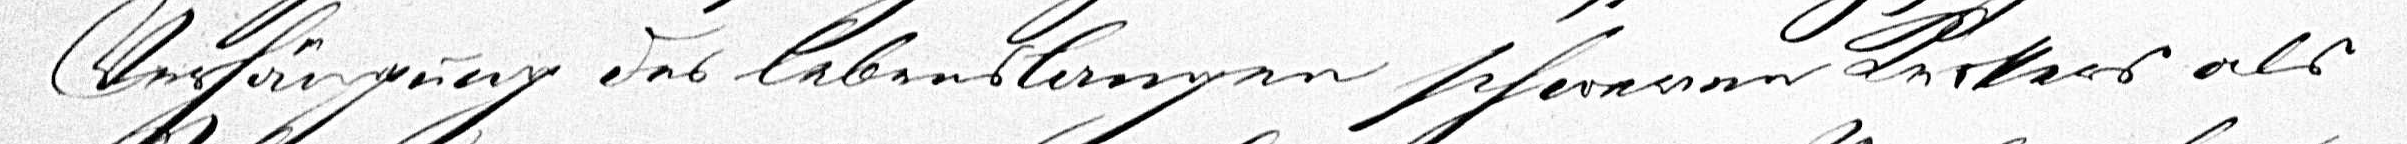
Verhängung des lebenslangen schweren Kerkers als
